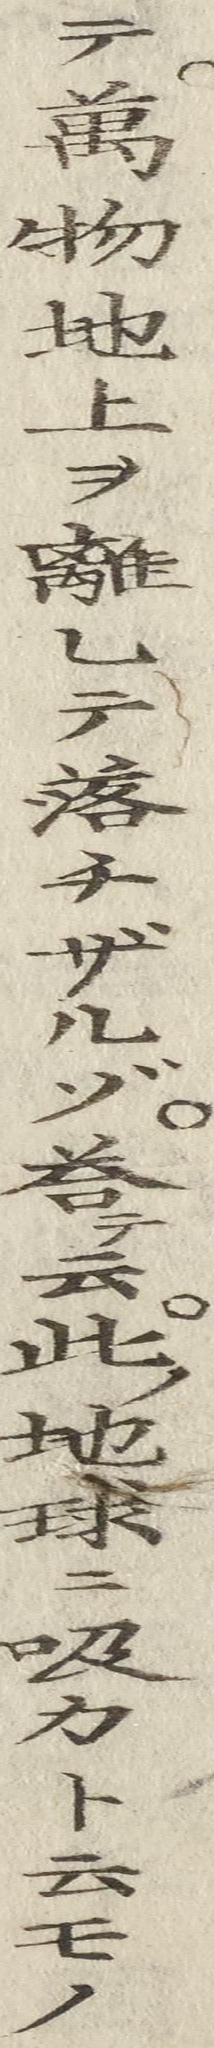テ。万物地上ヲ離レテ落チザルゾ。答云。此地球ニ吸カト云モノ
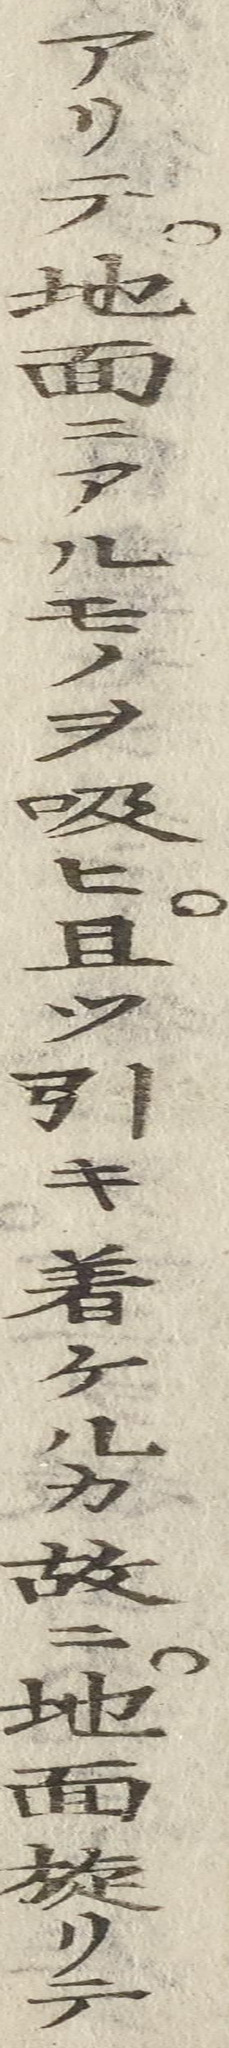アリテ。地面ニアルモノヲ吸ヒ。且ツ引キ着ケルカ故ニ。地面旋リテ
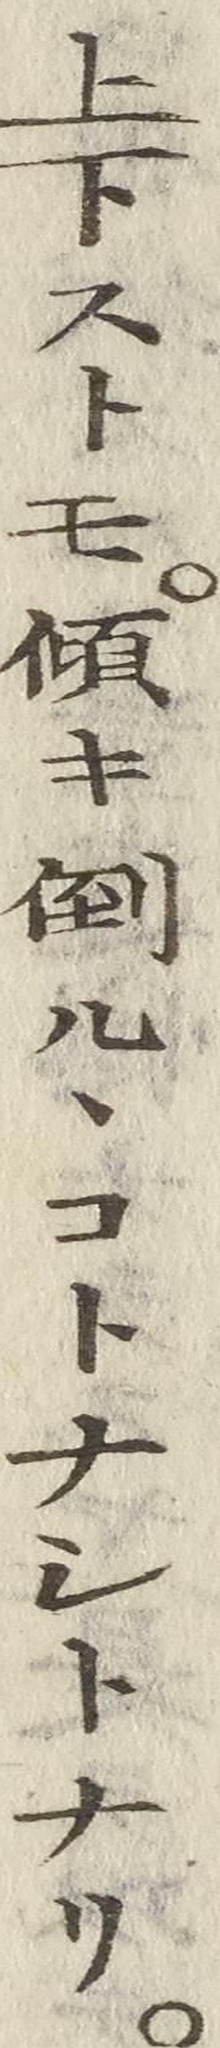上下ストモ。傾キ倒ルヽコトナシトナリ。
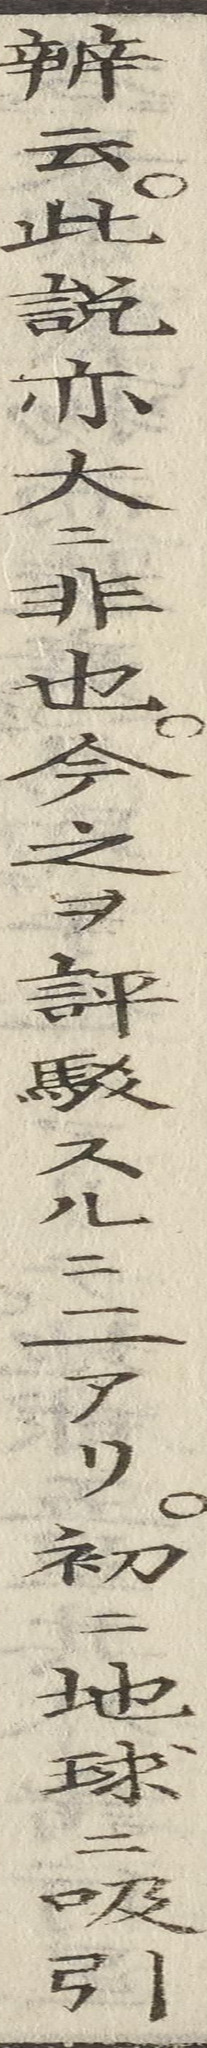弁云。此説亦大ニ非也。今之ヲ評駁スルニ二アリ。初ニ地球ニ吸引
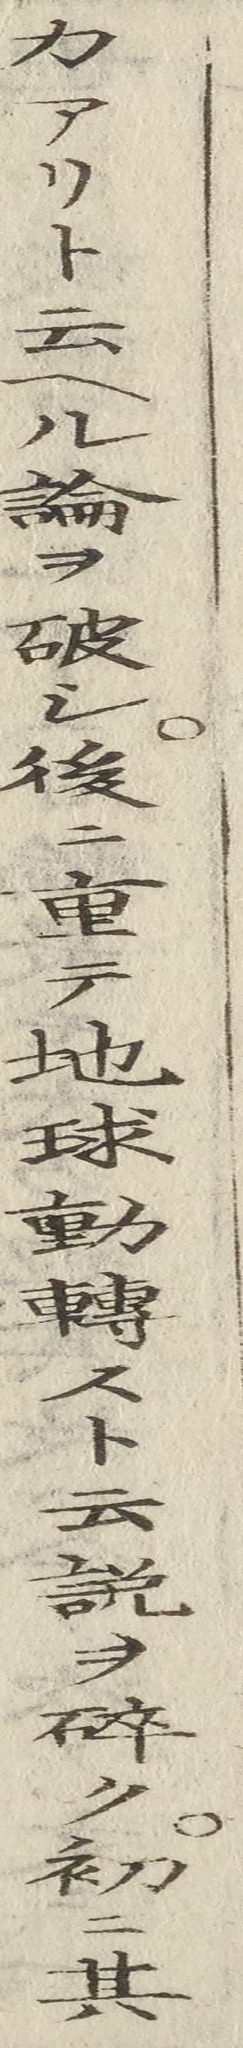カアリト云ヘル論ヲ破シ。後ニ重テ地球動転スト云説ヲ砕ク。初ニ其
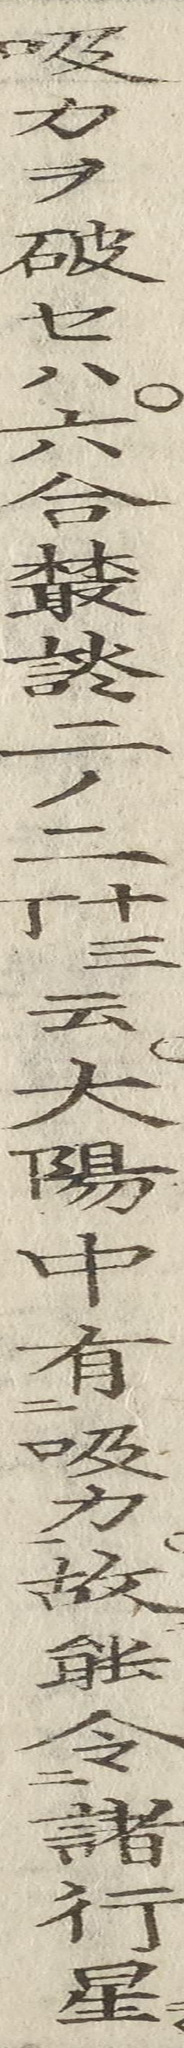吸カヲ破セハ。六合樷談二ノ二十三丁云。大陽中有吸カ。故能令諸行星。
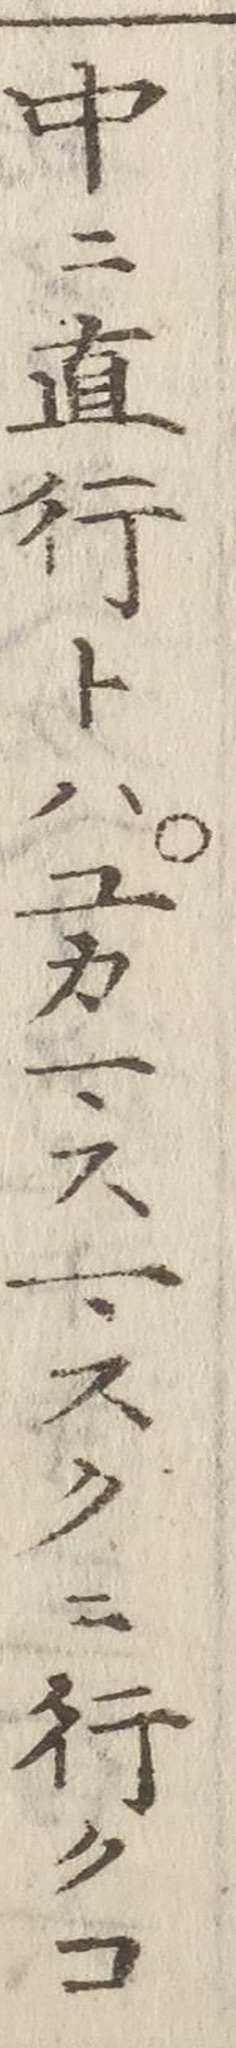中ニ直行トハ。ユカマスマスクニ行クコ
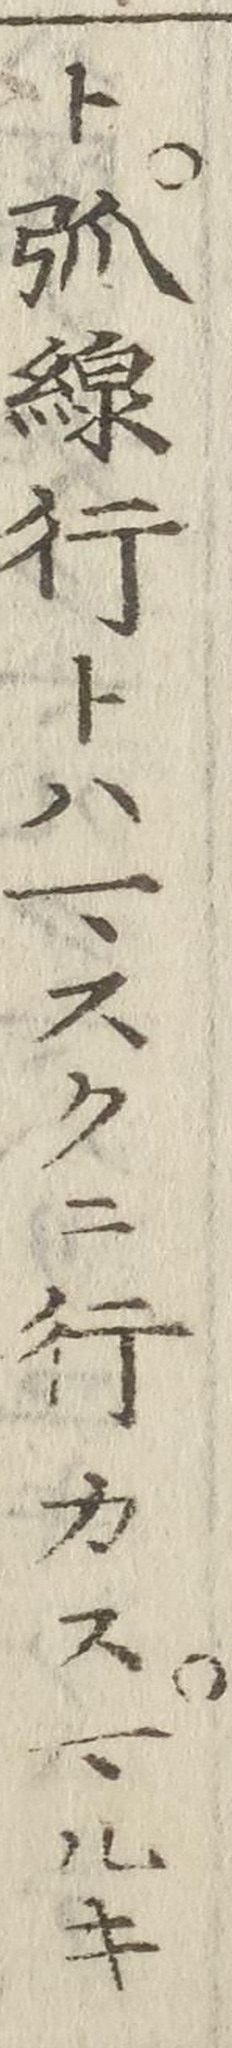ト。弧線行トハマスクニ行カス。マルキ

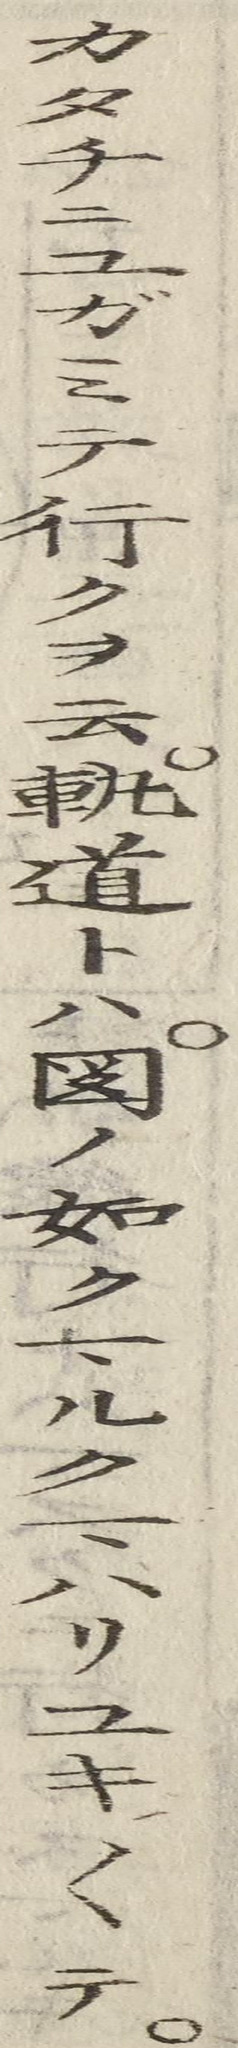カタチニユガミテ行クヲ云。軌道トハ。図ノ如クマルクマハリユキ〳〵テ。
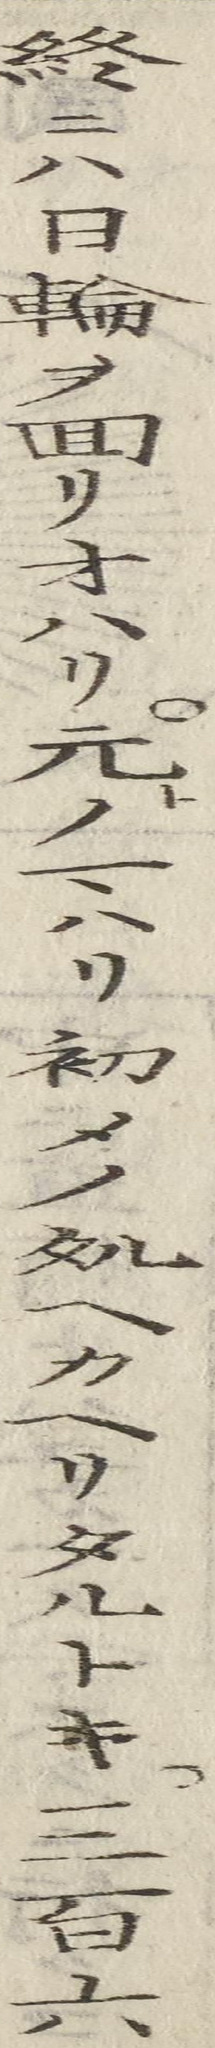終ニハ日輪ヲ回リオハリ。元初メノ処ヘカヘリタルトキ。三百六
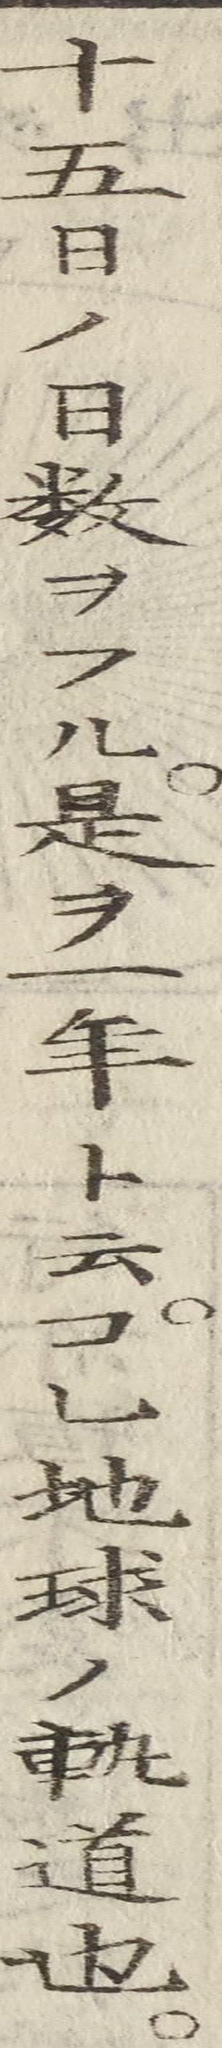十五日ノ日数ヲフル。是ヲ一年ト云。コレ地球ノ軌道也。
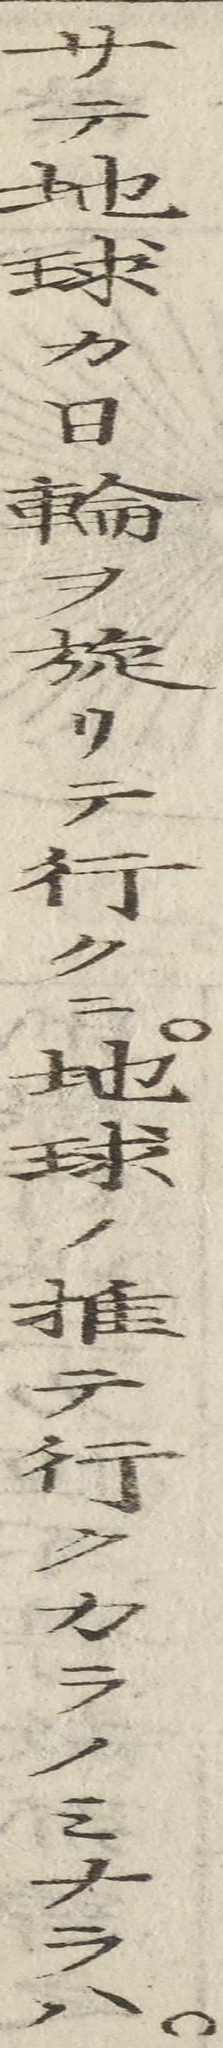サテ地球カ日輪ヲ旋リテ行クニ。地球ノ推テ行クカラノミナラハ。
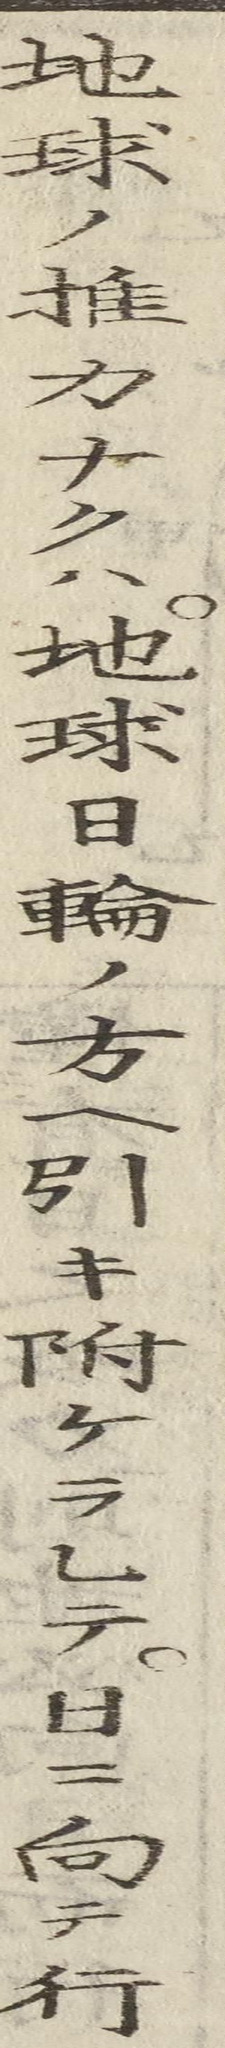地球ノ推カナクハ。地球日輪ノ方ヘ引キ付ケラレテ。日ニ向テ行
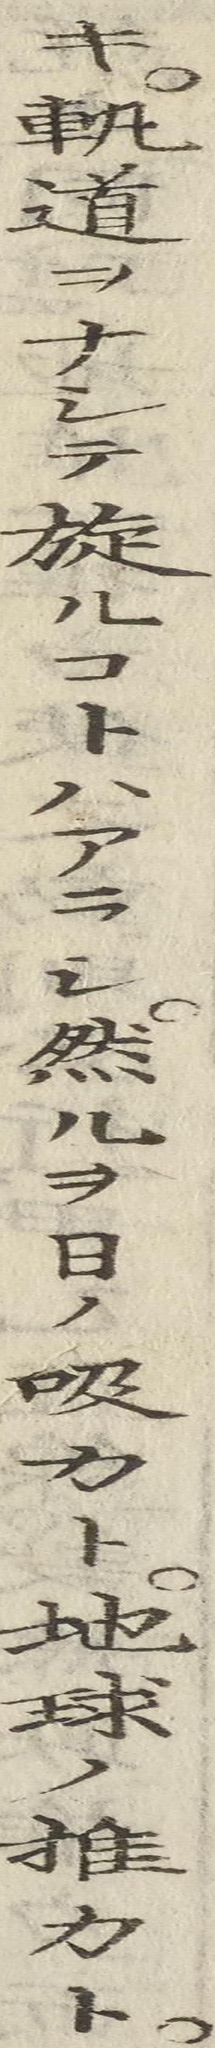キ。軌道ヲナシテ旋ルコトアラシ。然ルヲ日ノ吸カト。地球ノ推カト。
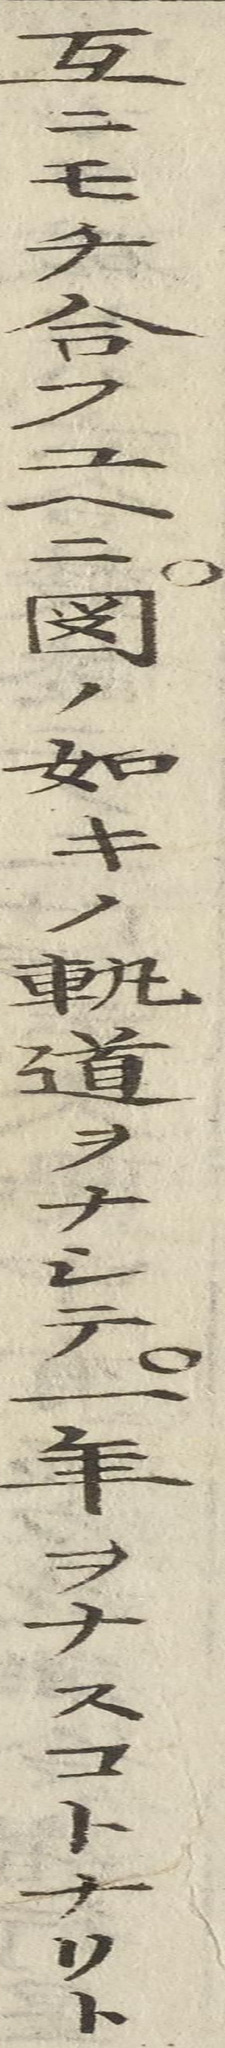互ニモチ合フユヘニ。図ノ如キノ軌道ヲナシテ。一年ヲナスコトナリト
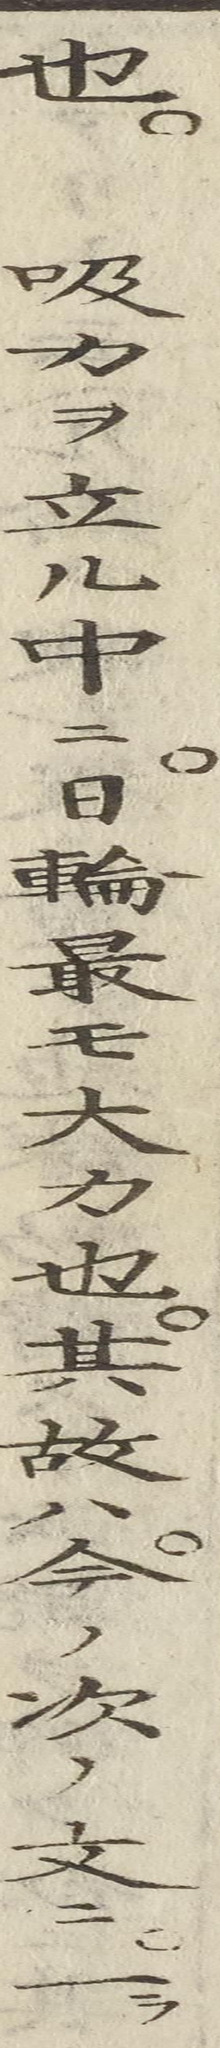也。吸カヲ立ル中ニ。日輪最モ大カ也。故ハ。今ノ次ノ文ニ。一
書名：護法新論　中
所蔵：東京大学地震研究所図書室 Earthquake Research Institute Library, The University of Tokyo, JAPAN
